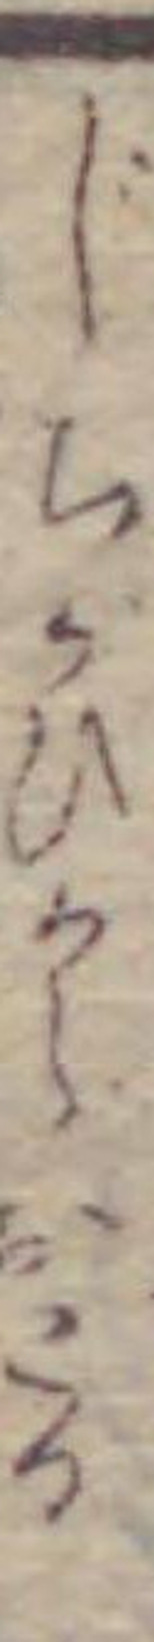じちかひからおこる
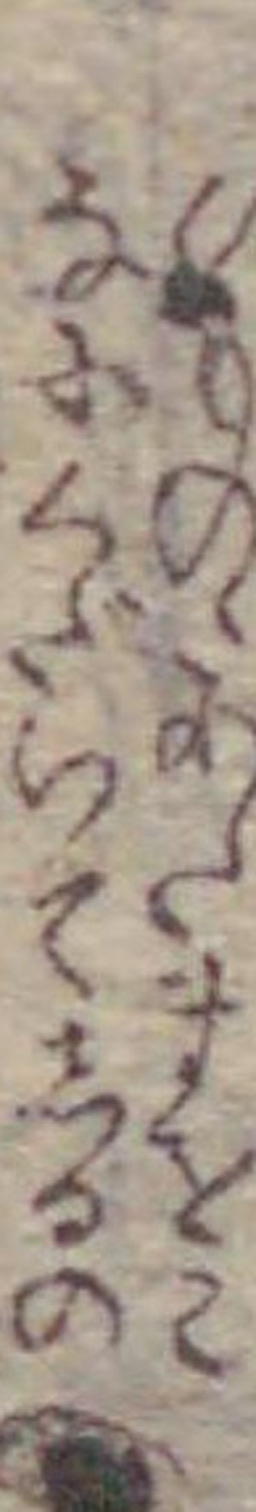なにくだいてしるの
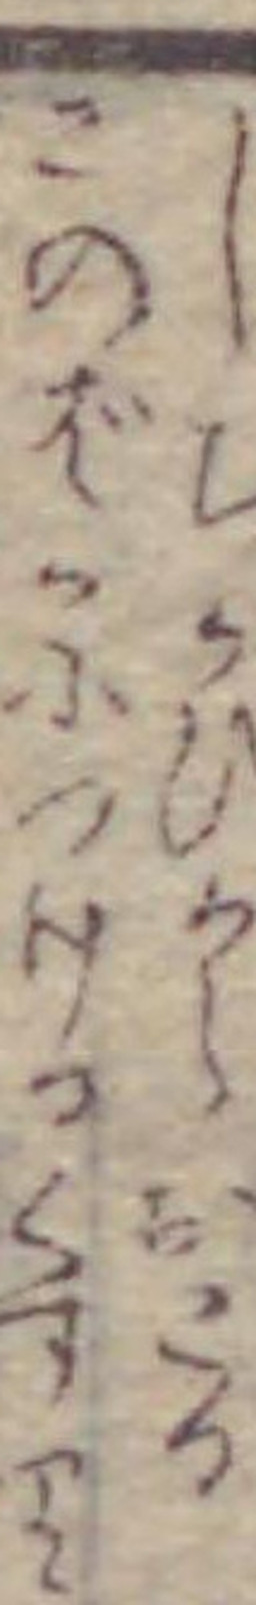このばかにつけるくすり
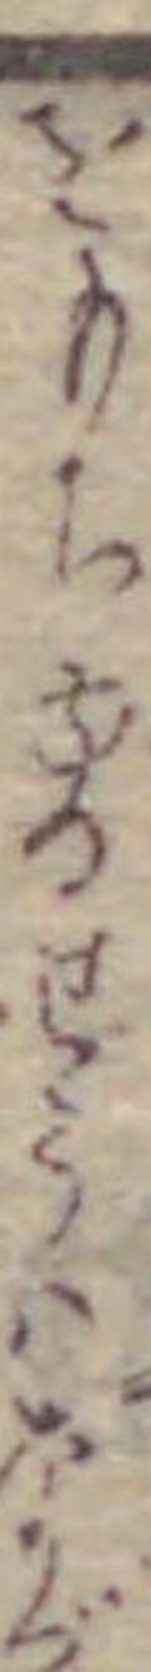をもちゆるせうはなが
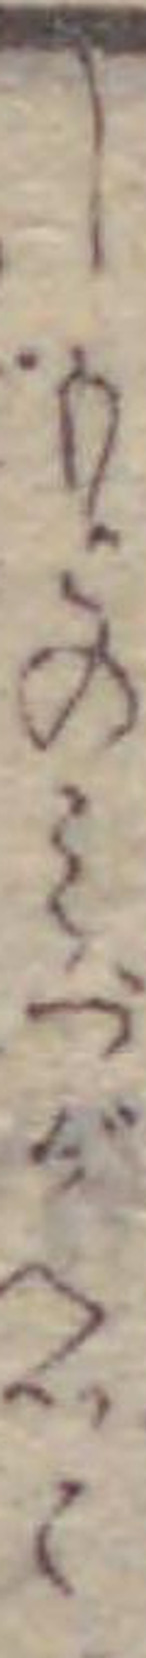しもとのみづがへつて
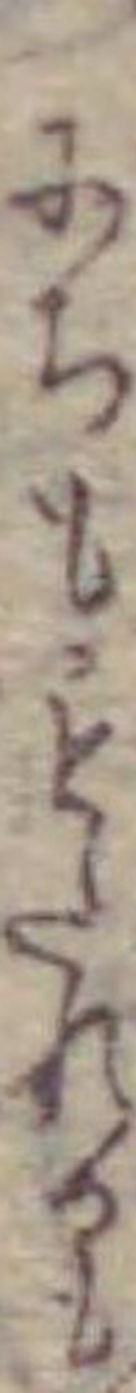にちもとたれるも
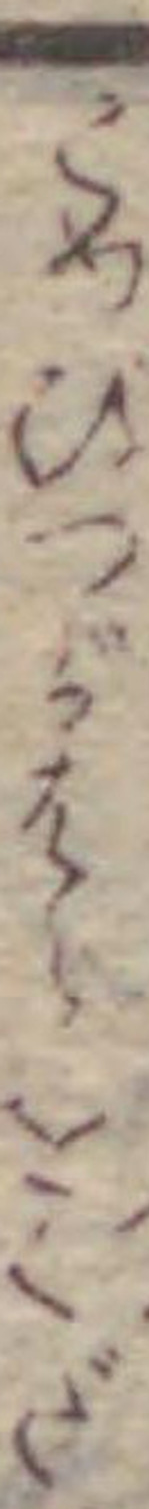こめびつがはらをくだ
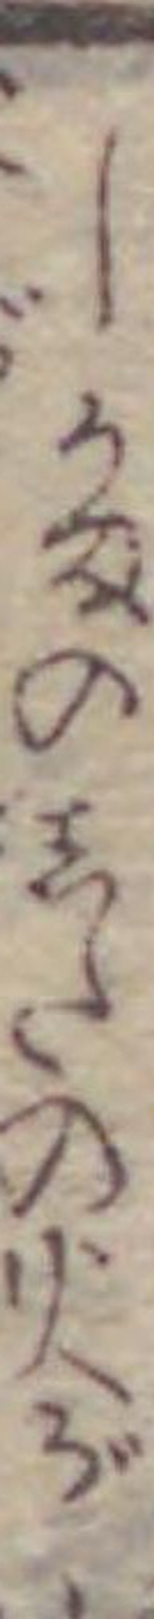しかまのしたの火が
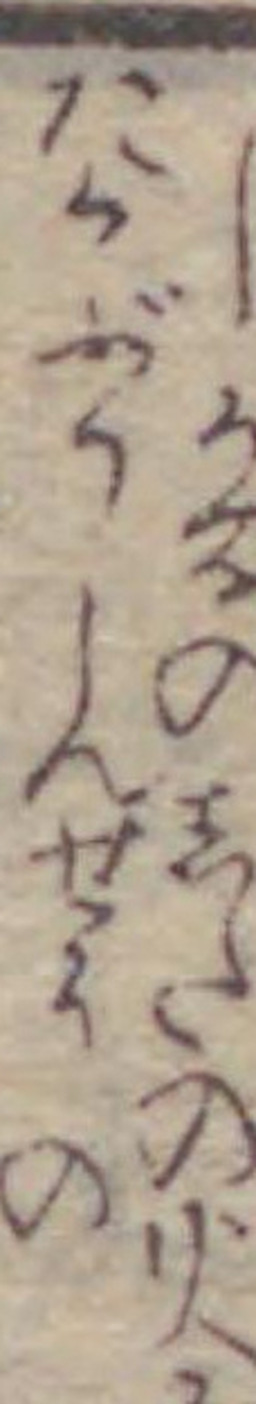たかぶりしんせうの
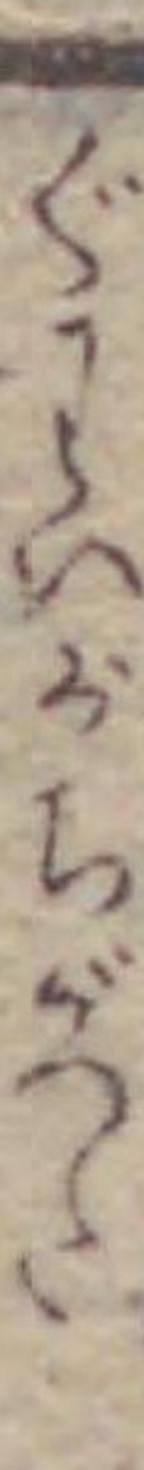ぐわいがちがつた
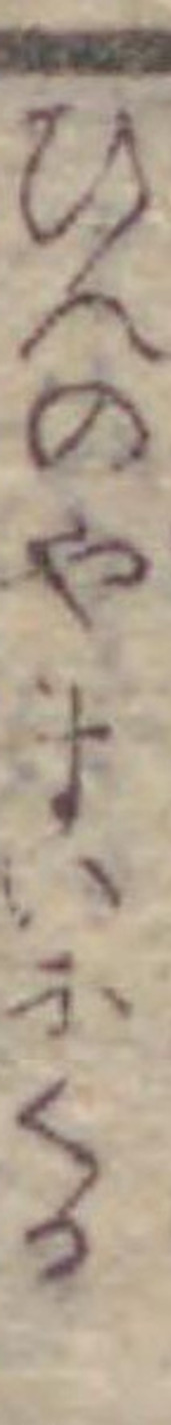ひんのやまいにくる
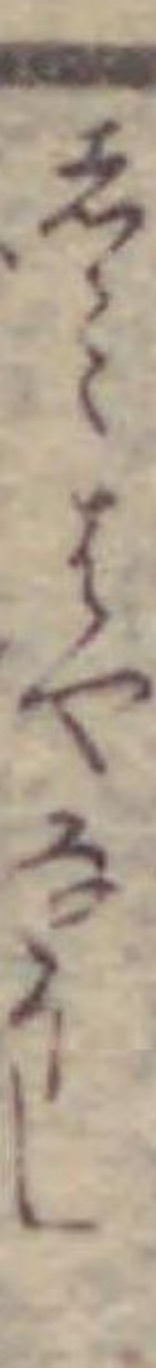しみはやなほし
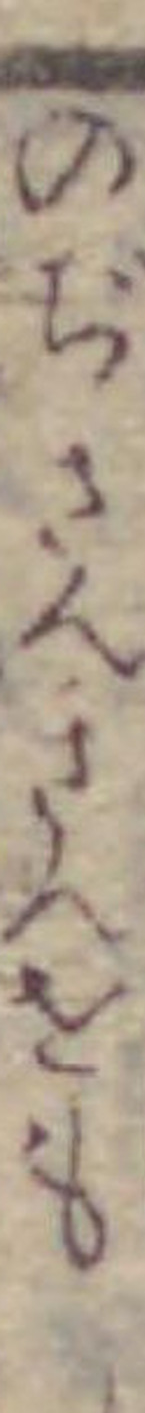のぢさんきんをも
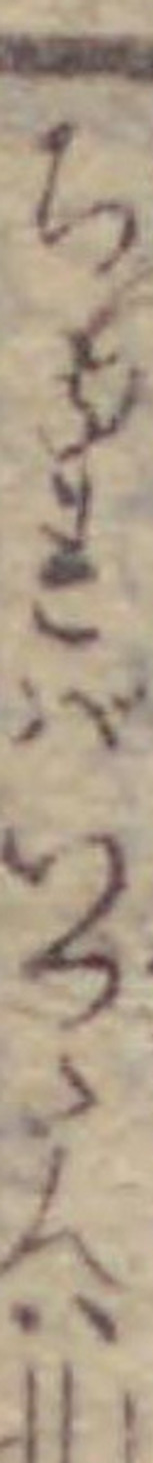ちゆればいつたんは
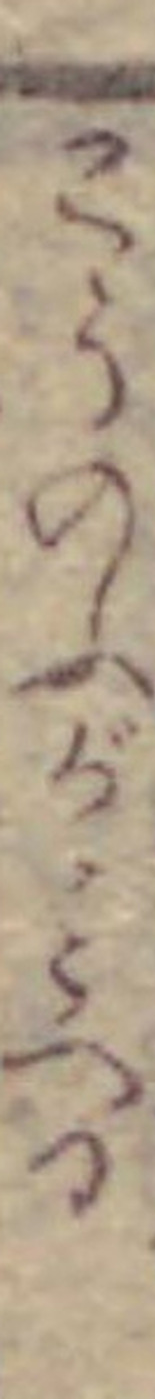こうのふがみへる
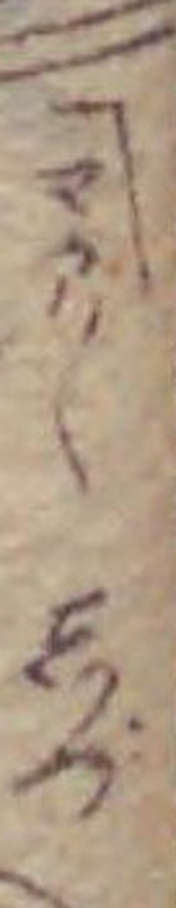〽マア〳〵しづ
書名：鼻下長生薬 : 3巻
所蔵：国立国会図書館 National Diet Library, JAPAN
